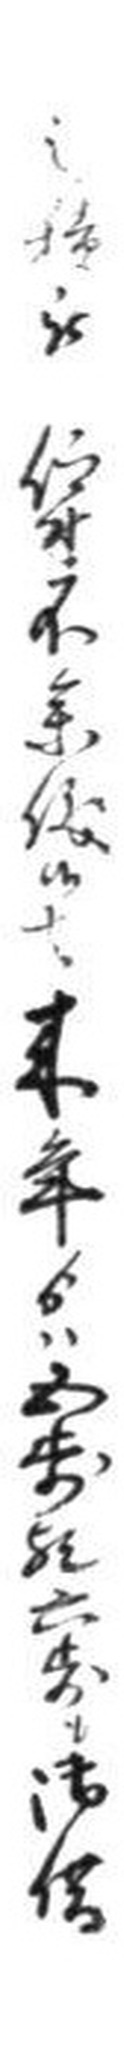之積被仰付不参儀候者来年ゟㇵ五歩歟六歩も御借
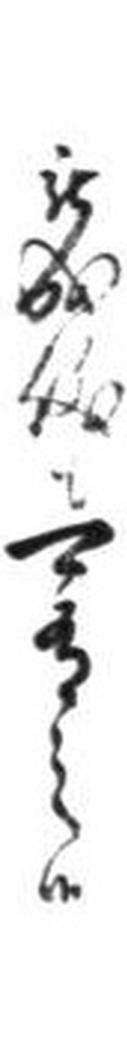被成儀も可有之候
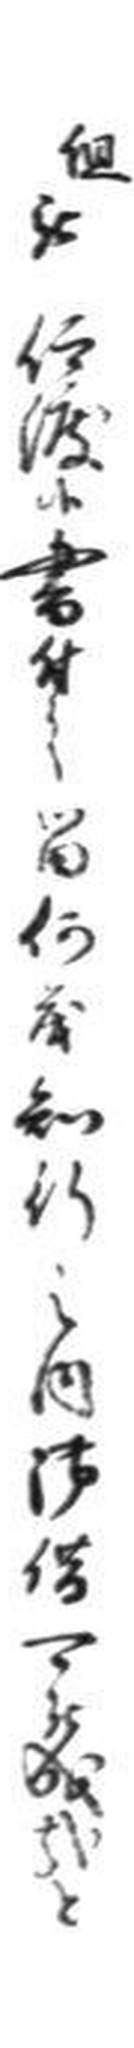但被仰渡候書付之留何も知行之内御借可被成哉と
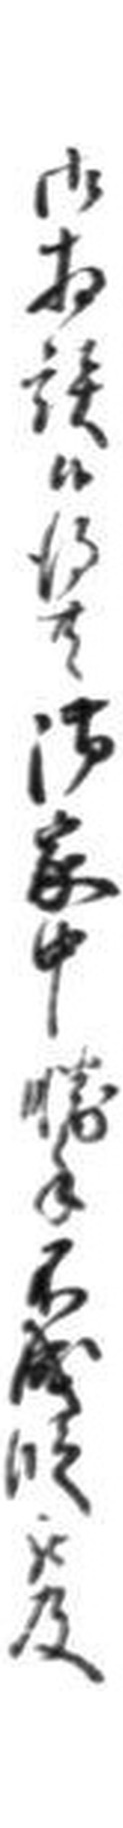御相談候得共御家中勝手不成段被及
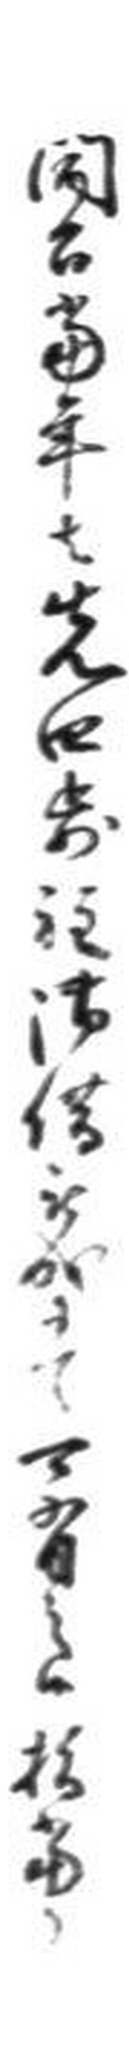聞召当年者先四歩程御借被成にて可有之候指当り
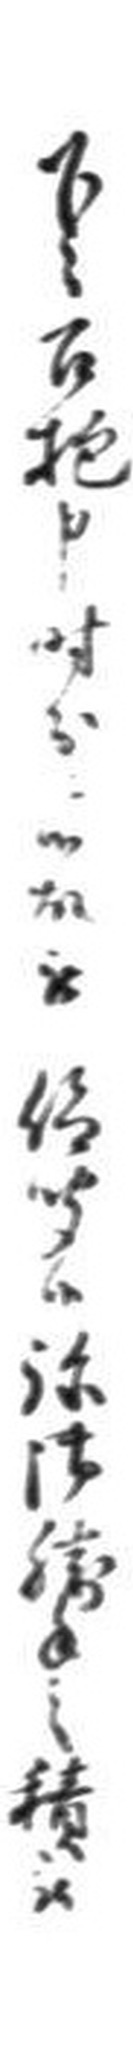下々召抱申時分ニ候故被仰聞候弥御勝手之積被
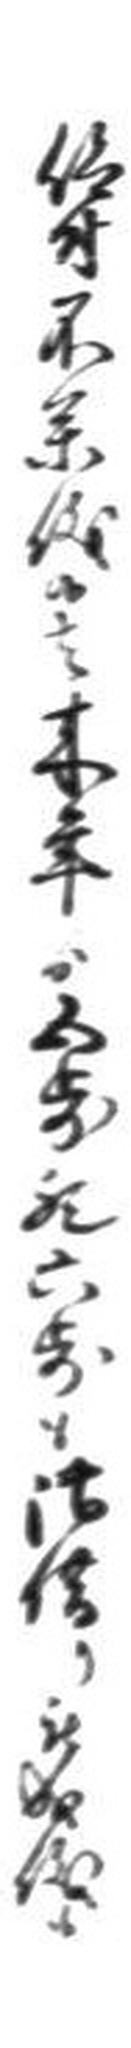仰付不参儀候者来年ゟ五歩歟六歩も御借り被成儀も
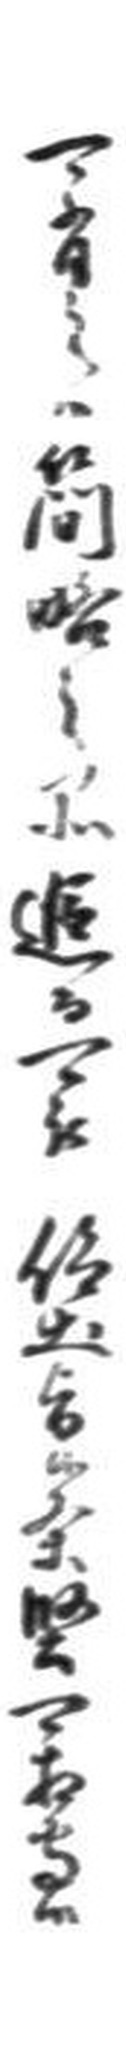可有之候簡略之品追而可被仰出旨候条堅可相守候
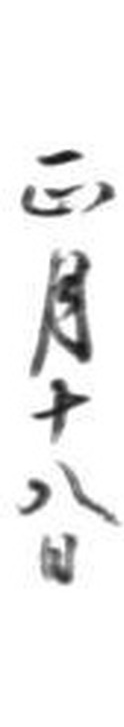正月十八日
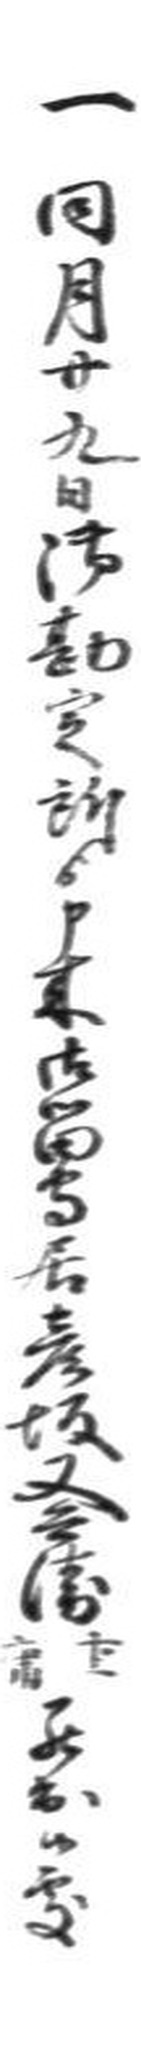一同月廿九日御勘定所ゟ申来御留守居彦坂又兵衛重庸罷出候処
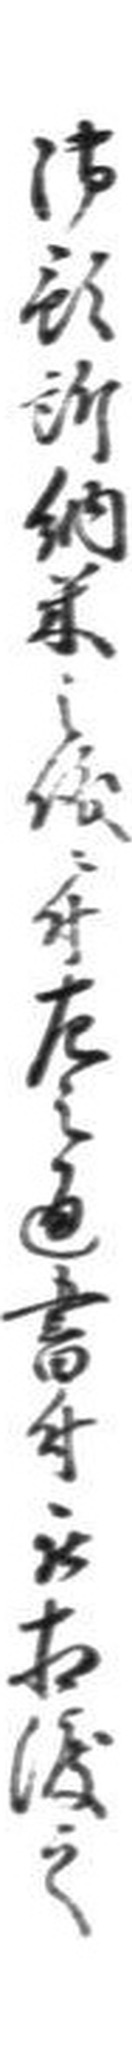御預所納米之儀ニ付左之通書付被相渡之

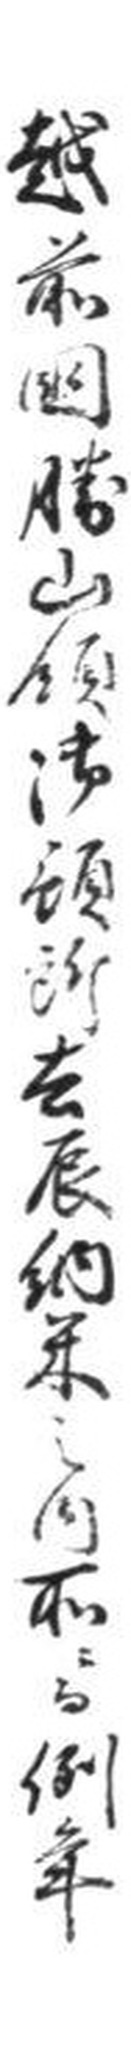越前国勝山領御預所去辰納米之内所ニ而例年
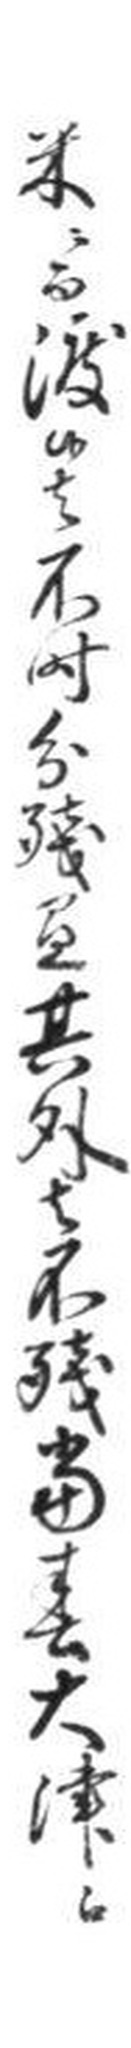米ニ而渡候者不時分残置其外者不残当春大津江
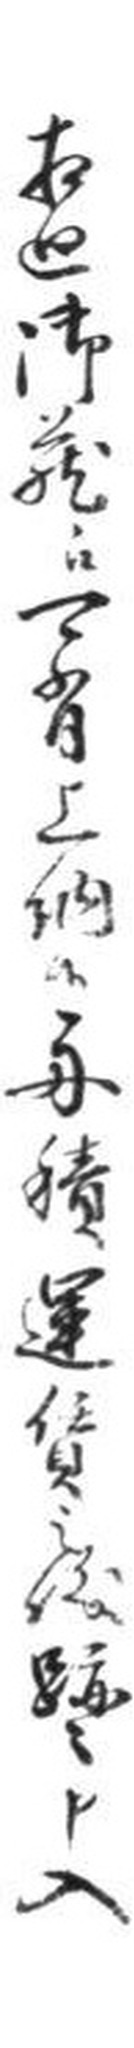相廻御蔵江可有上納候舟積運賃之儀跡々申入
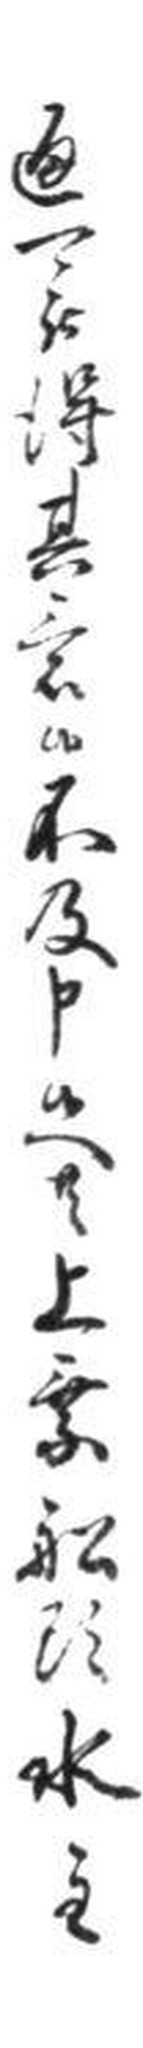通可被得其意候不及申候へ共上乗船頭水主
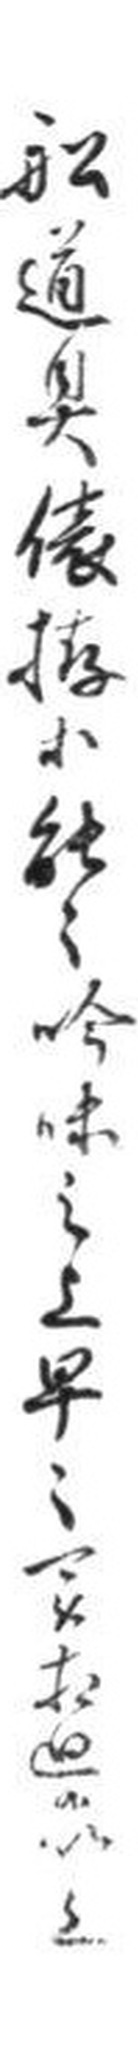船道具俵拵等能々吟味之上早々可被相廻候以上
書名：家譜 十三 綱昌公 従寛文元年到延宝五年
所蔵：福井県文書館 Fukui Prefectural Archives
